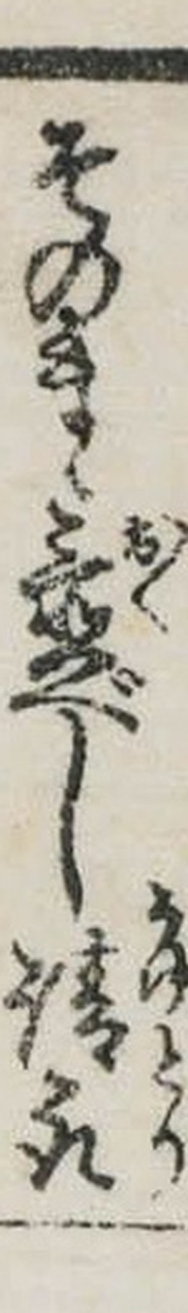そのまゝ置べし請取
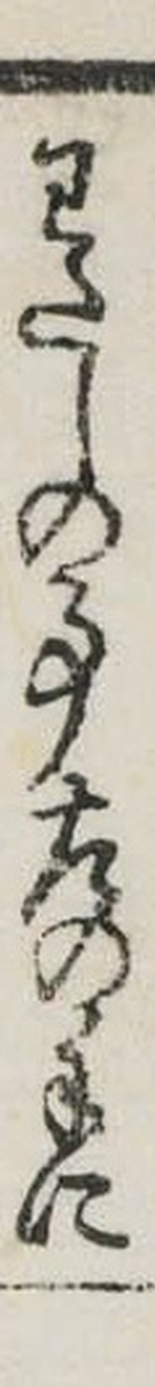わたしの事左の手に
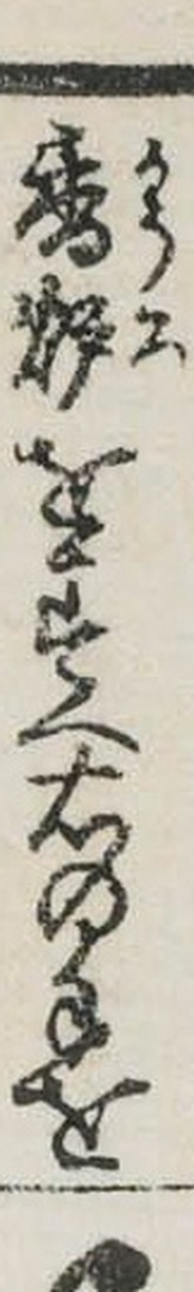香炉をすへ右の手を
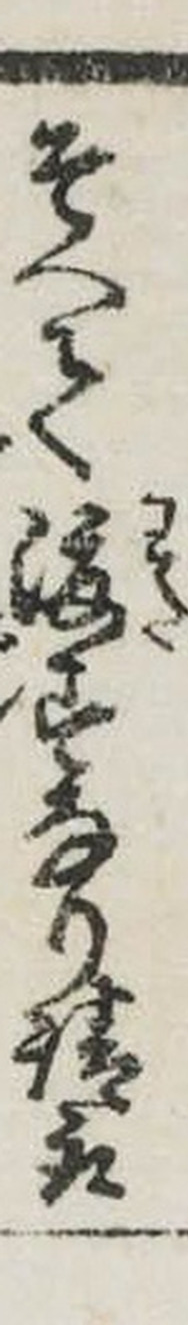そへて渡すなり請取
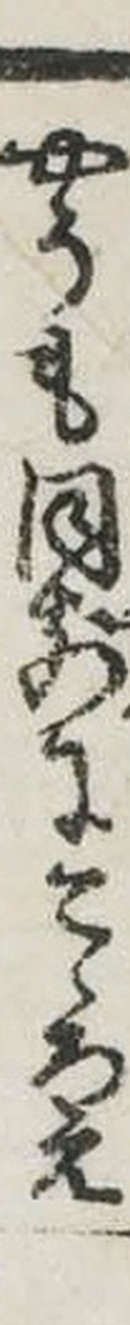やうも同前にこゝろえ
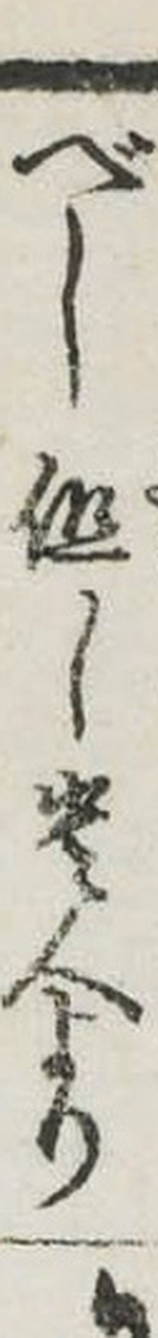べし但し貴人より
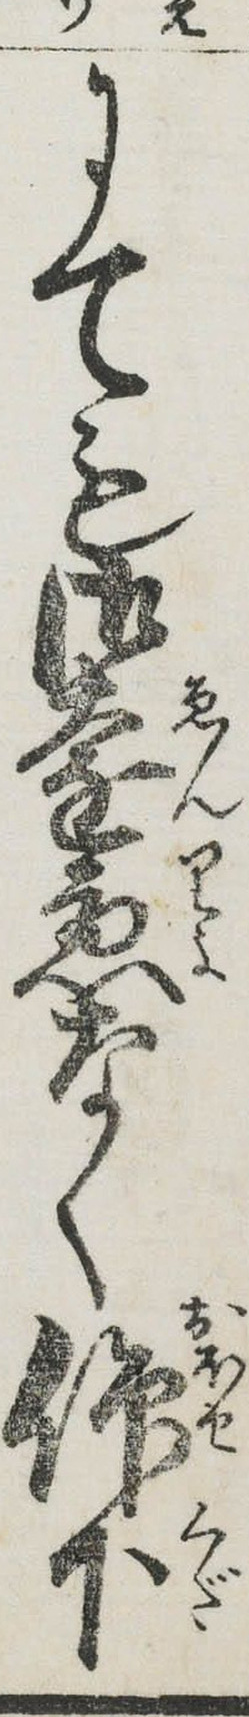にても御遠慮なく仰下
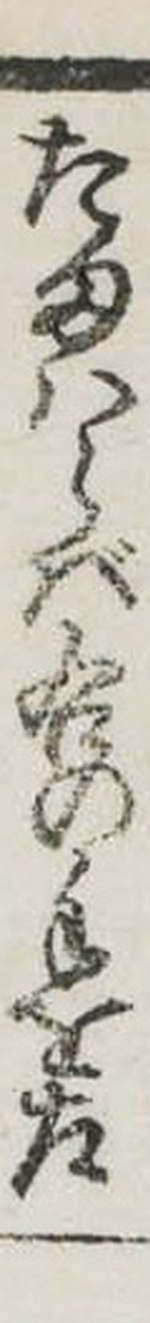たまはらば右の手を左
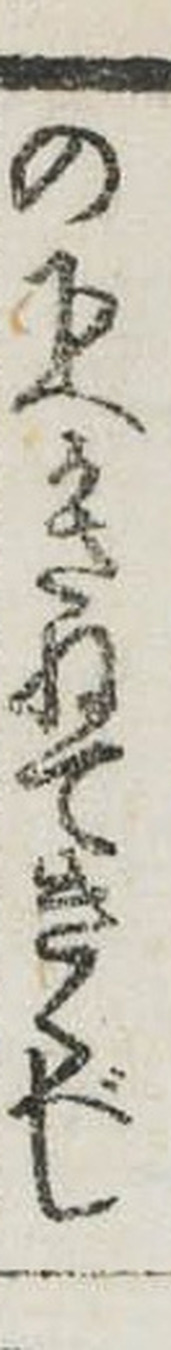の下へかさねてきくべし
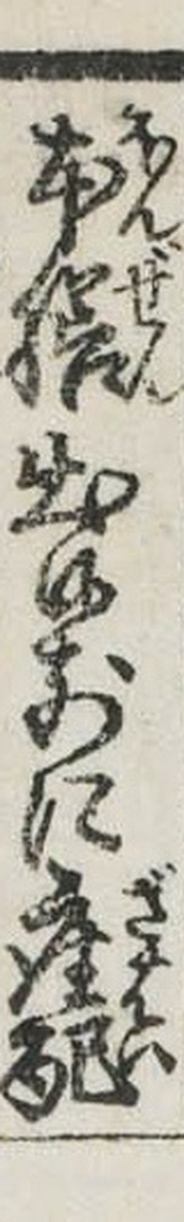本膳出候前に座配
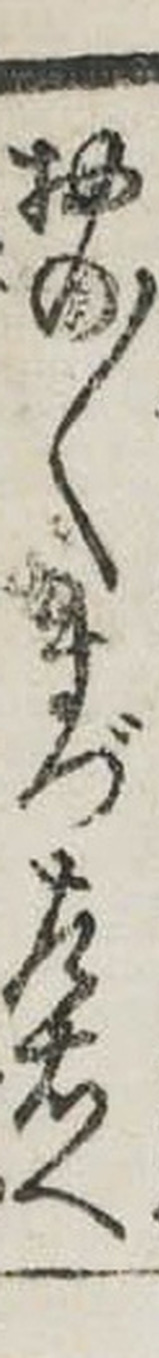おの〳〵まづ左右へ
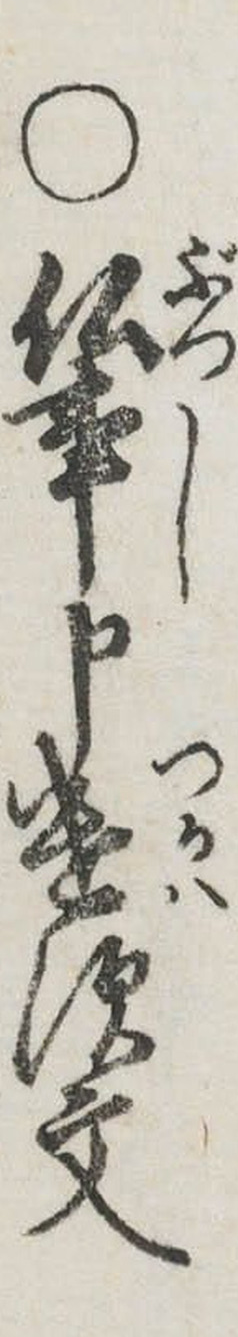○仏事申遣す文
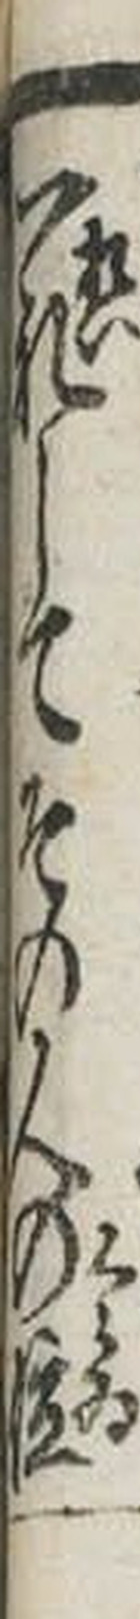一礼してその人の位
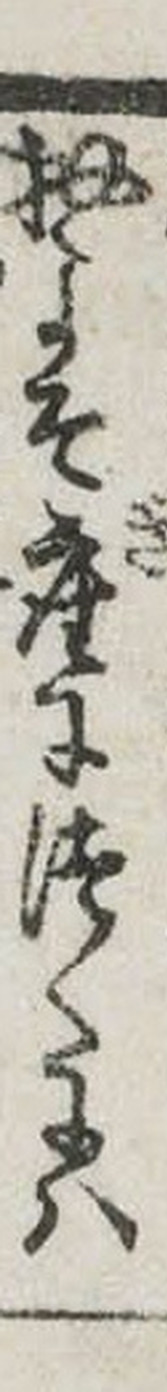およそ座につくには
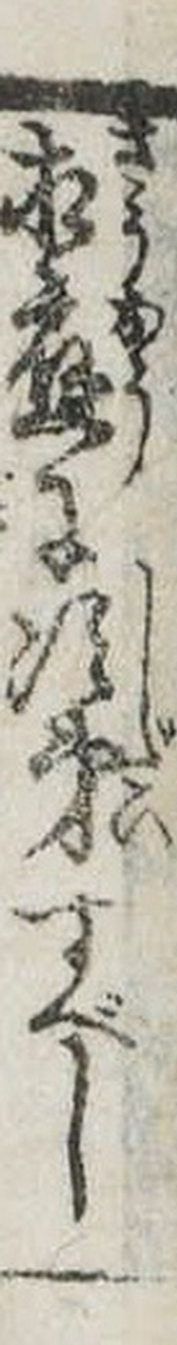相応に次第すべし
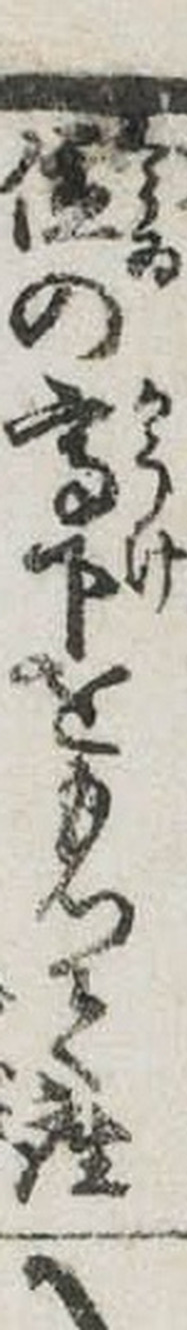位の高下をもつて座
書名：頭書萬用婦人手紙之文言
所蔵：東京学芸大学教育コンテンツアーカイブ
